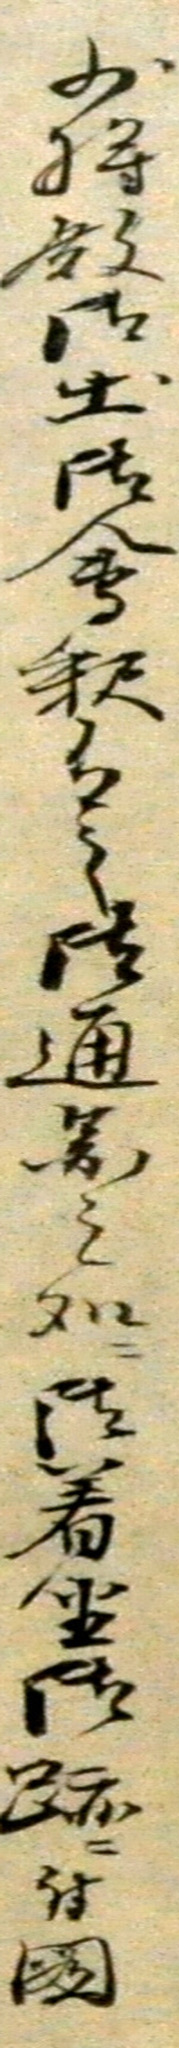少将殿御出御會釈有之御通圖之処ニ御着坐御跡ニ付圖
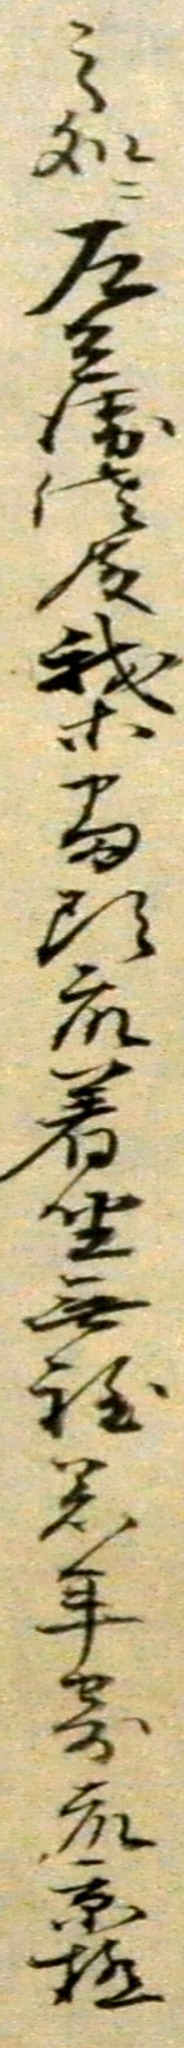之処ニ左兵衛佐殿我等番頭衆着坐無程若年寄衆京極
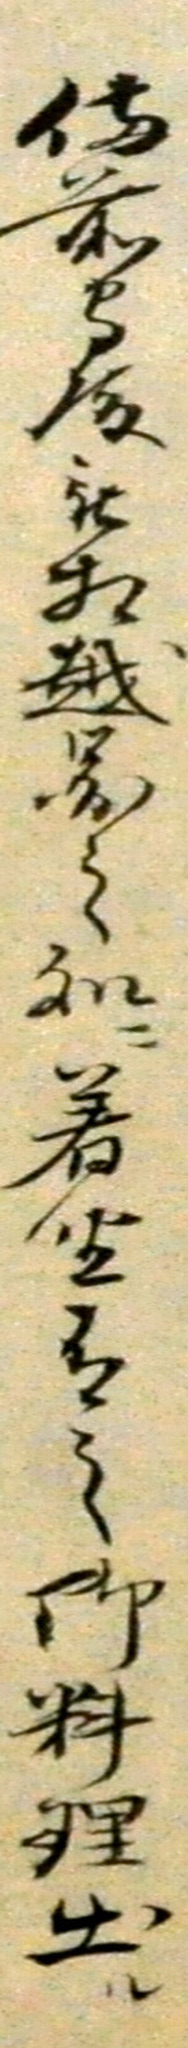備前守殿被相越圖之処ニ着坐有之御料理出ル
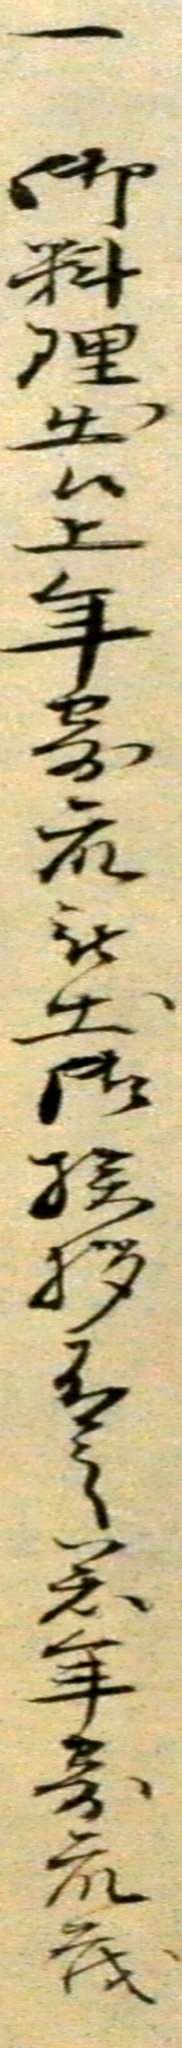一御料理出候上年寄衆被出御挨拶有之若年寄衆も
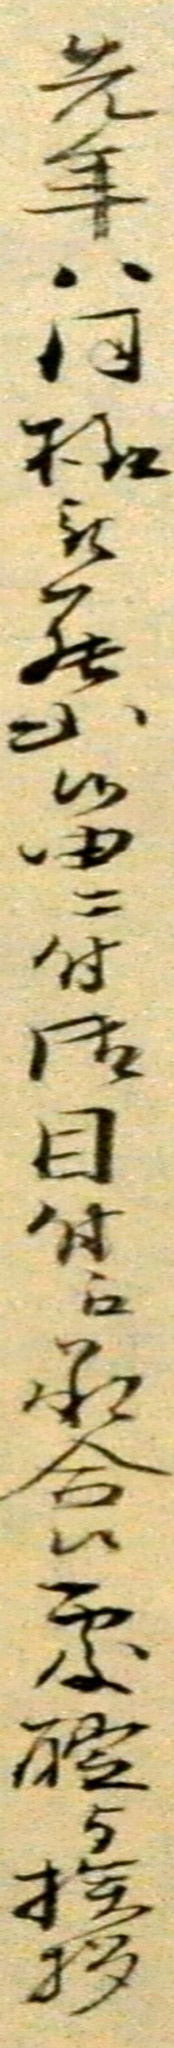先年ハ同様被罷出候由ニ付御目付え承合候處聢と挨拶
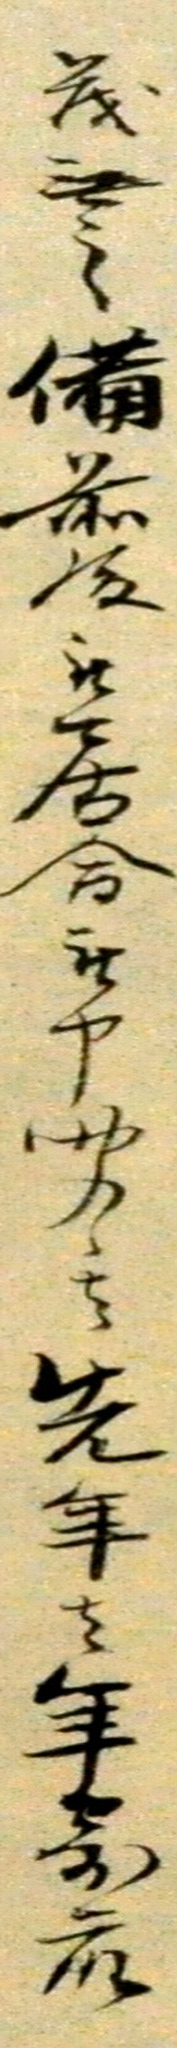も無之備前殿被居合被申聞候は先年は年寄衆
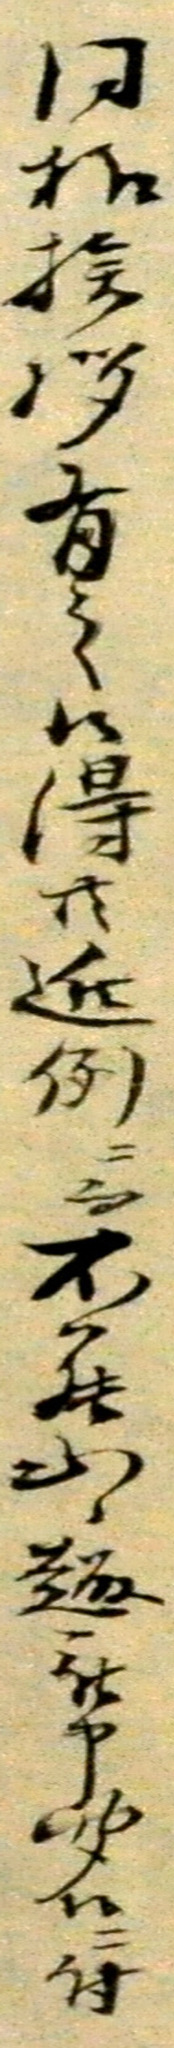同様挨拶有之候得共近例ニ而不罷出候趣被申聞候ニ付
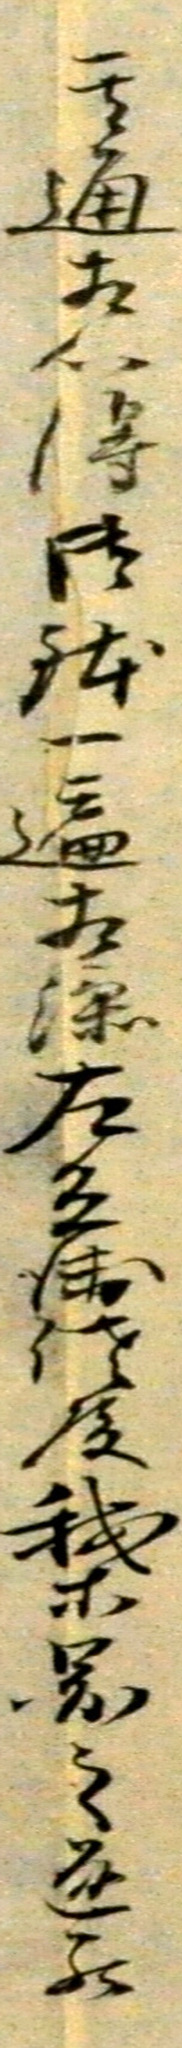其通相心得御鉢一遍相済左兵衛佐殿我等圖之通罷
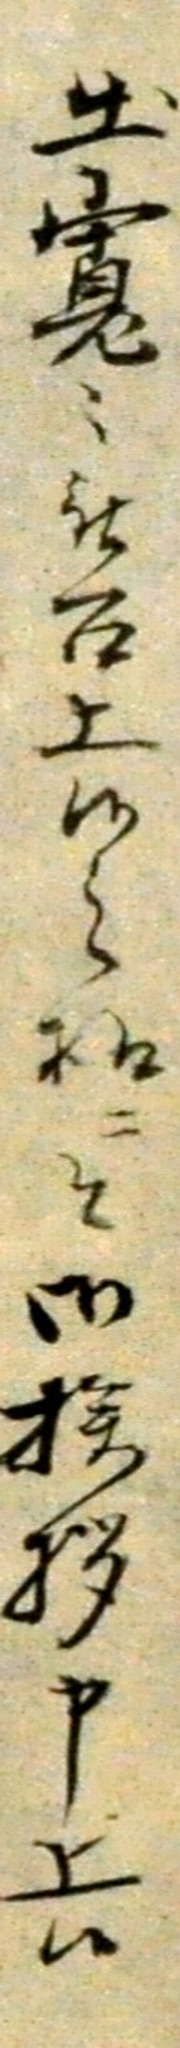出寛々被召上候之様ニと御挨拶申上候
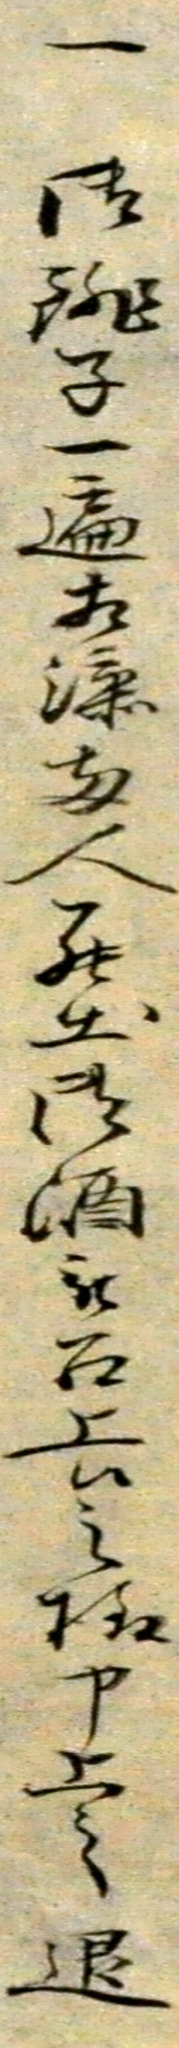一御銚子一遍相済両人罷出御酒被召上候之様申上之退
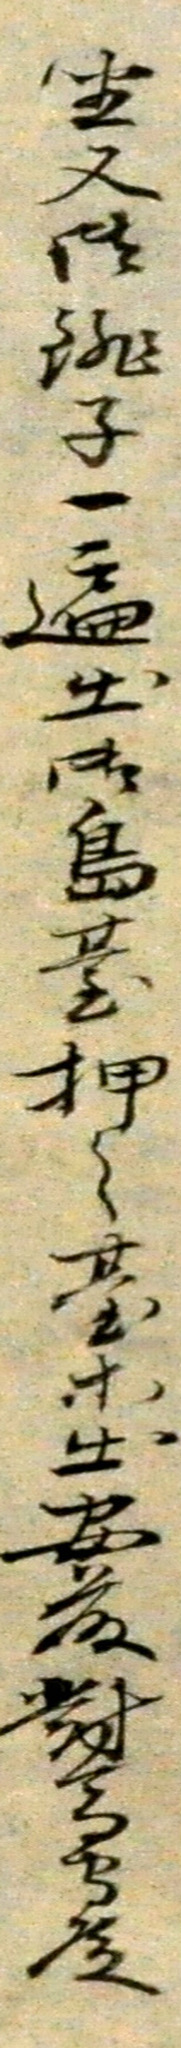坐又御銚子一遍出御島臺押之臺等出安藤對馬守殿
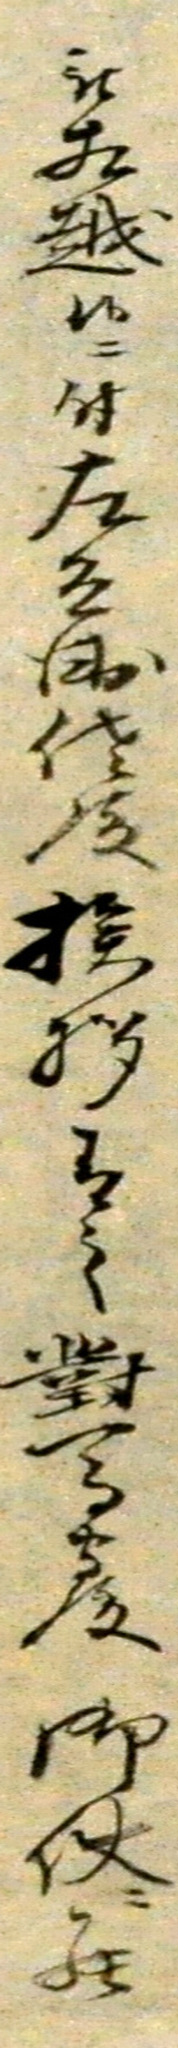被相越候ニ付左兵衛佐殿挨拶有之對馬守殿御使ニ罷
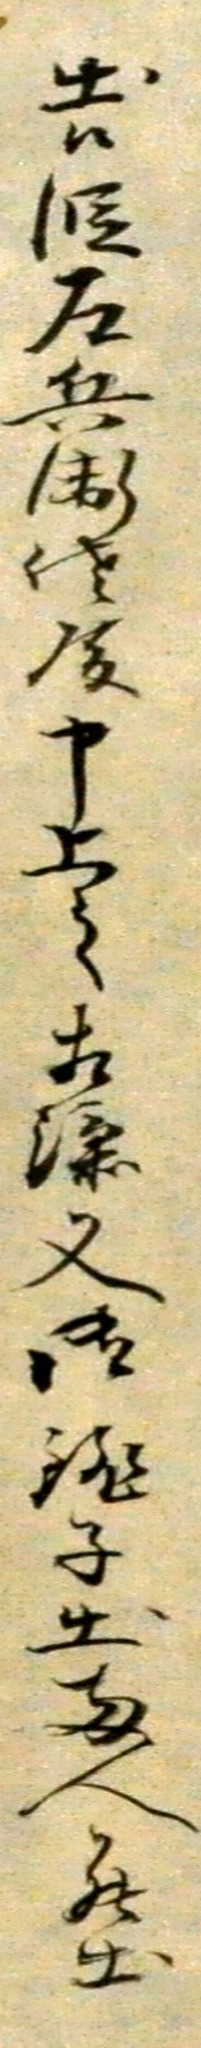出候段左兵衛佐殿申上之相済又御銚子出両人罷出
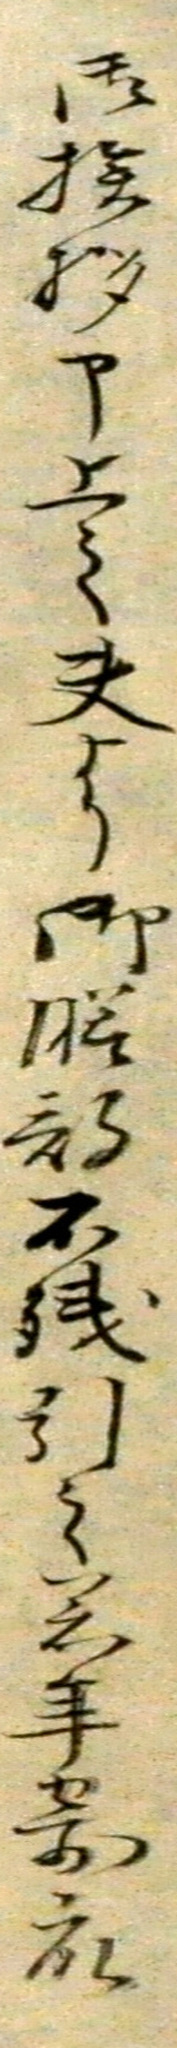御挨拶申上之夫より御膳部不残引之若年寄衆
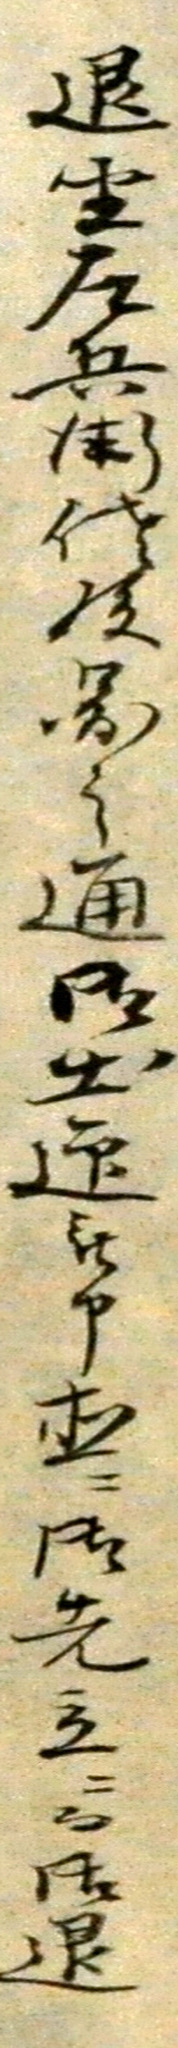退坐左兵衛佐殿圖之通御出迎被申直ニ御先立ニ而御退
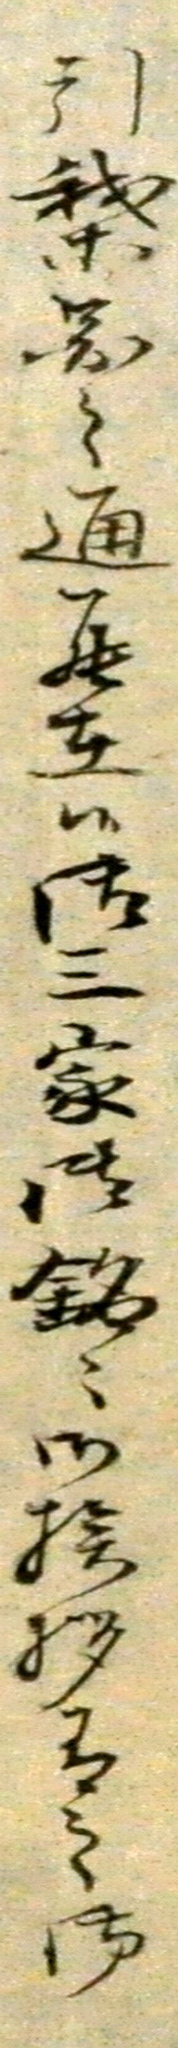引我等圖之通罷在候御三家御銘々御挨拶有之御
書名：竹ノ間御座席奉行勤方控外
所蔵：伊那市立高遠町図書館・合同会社AMANE
